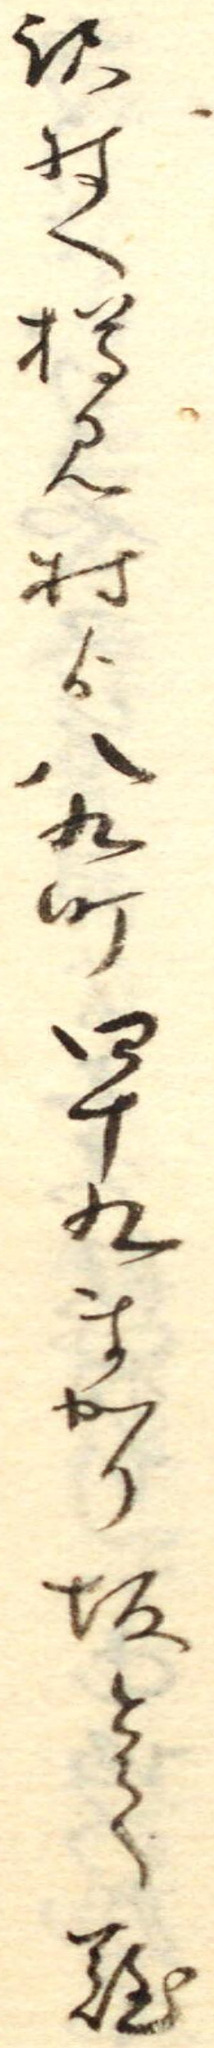沢村へ樽見村ゟ八九町四十九まかり坂とて難
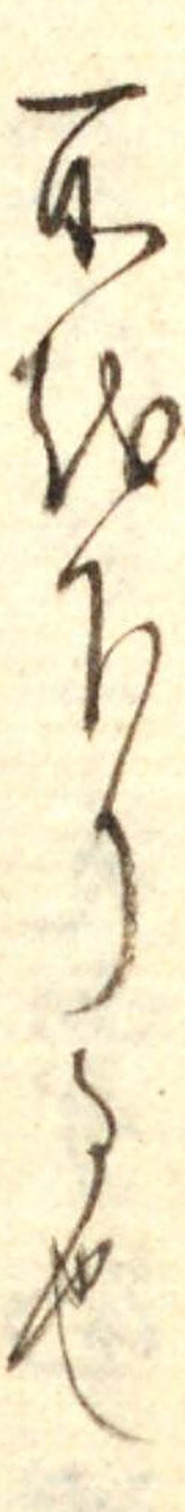所を下りる也
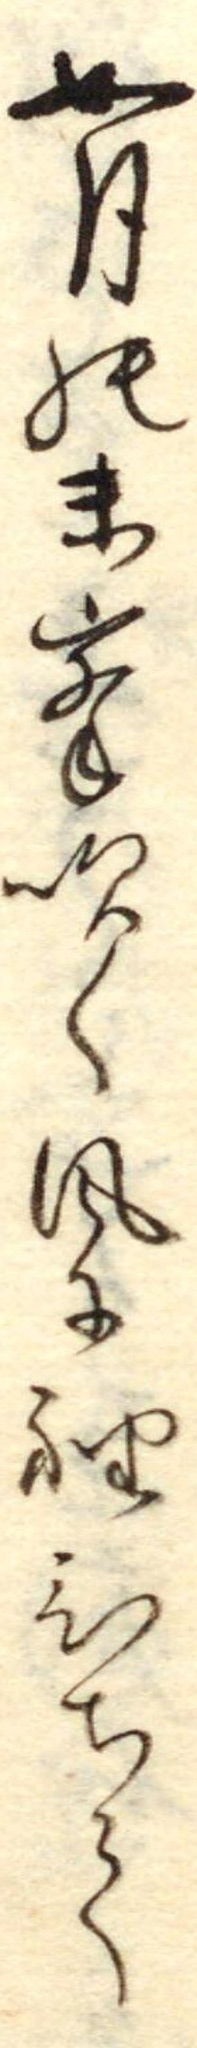如月の末峯吹く風に袖ひちて
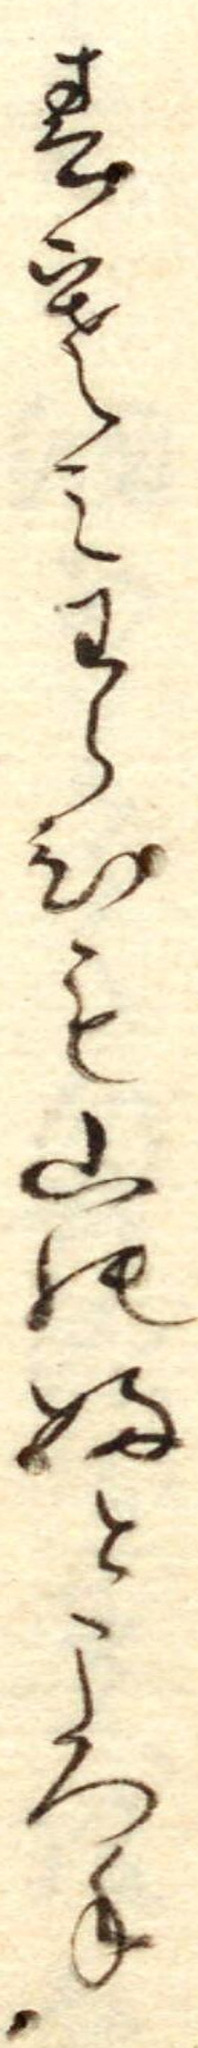春寒みわらひも山の好ところね
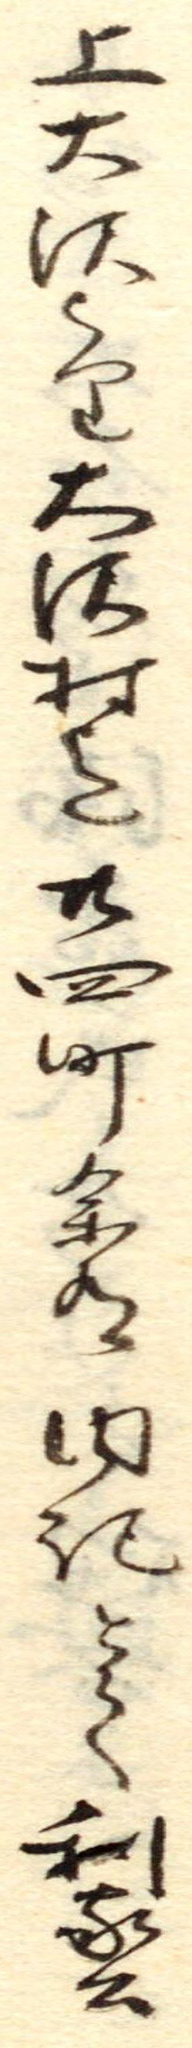上大沢より大沢村迄廿四町余有内記とて利家公
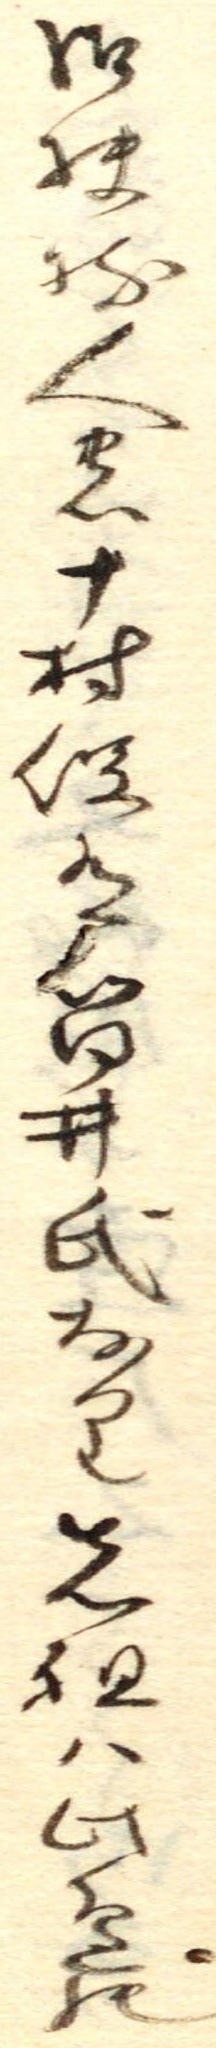御扶持人の十村役有筒井氏なり先祖は此辺の
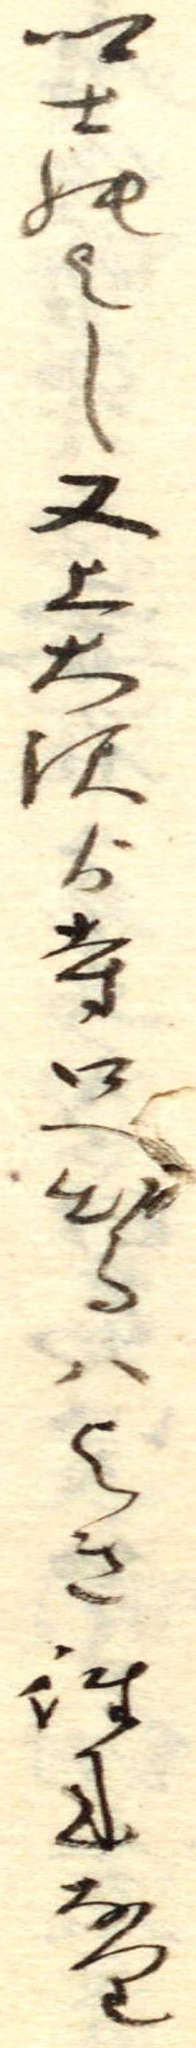郷士のよし又上大沢ゟ寺口へ出るはよき往来なり
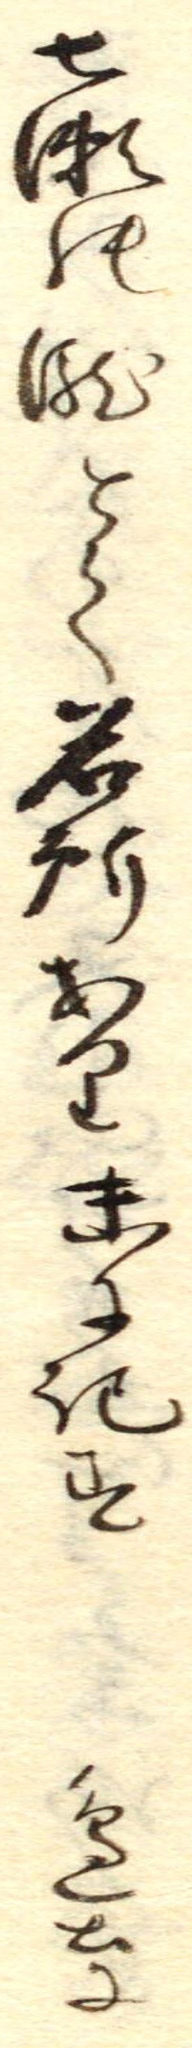七瀬の瀧とて名所あり末に記す辺土に
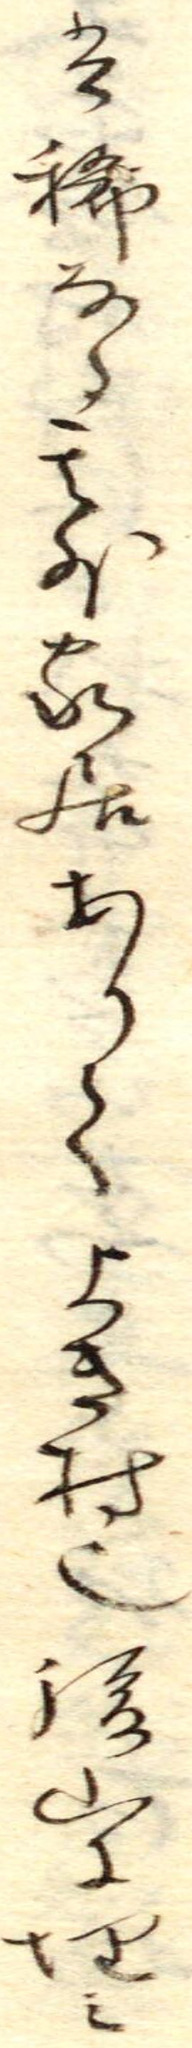は稀なる其外家居ありてよき村也後山に埋み
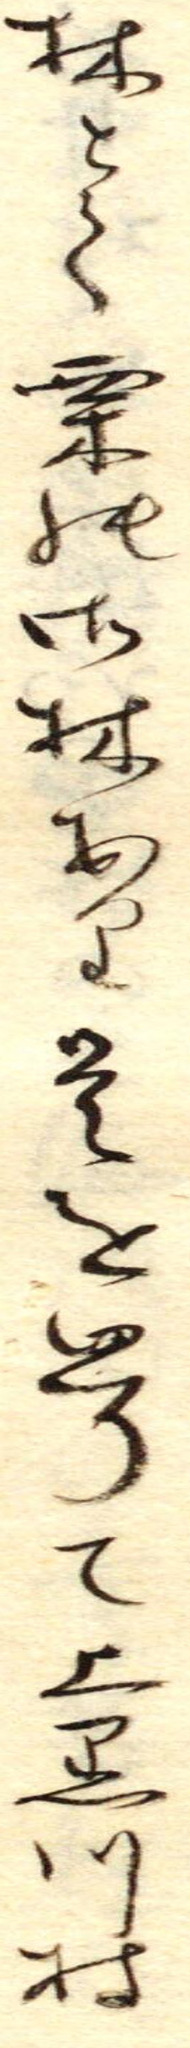林とて栗林御林あり是を廻りて上黒川村

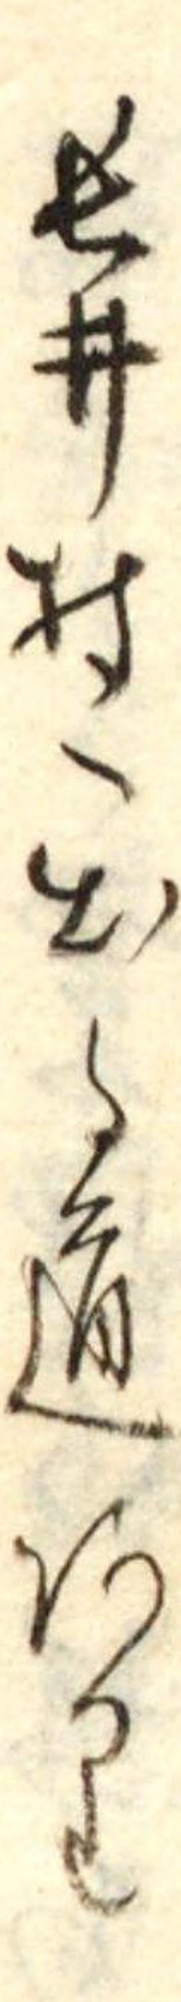長井村へ出る道あり
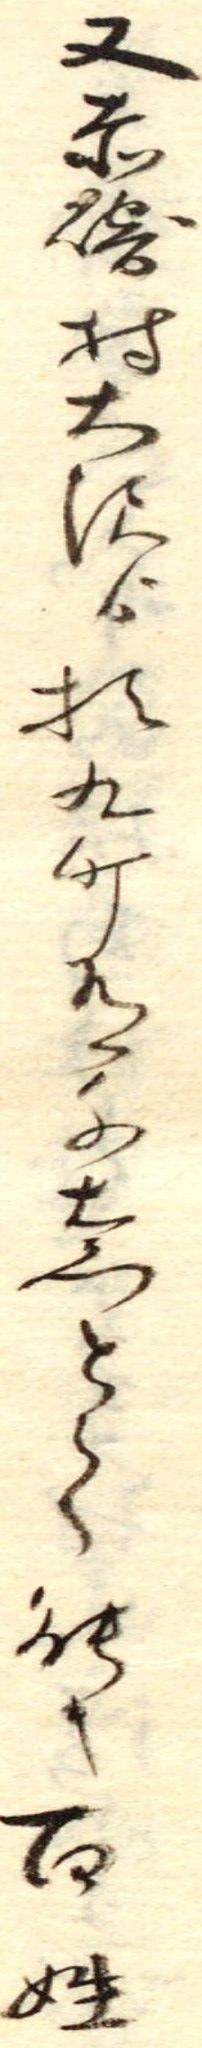又赤崎村大沢ゟ拾九町有千右衛門とて能き百姓
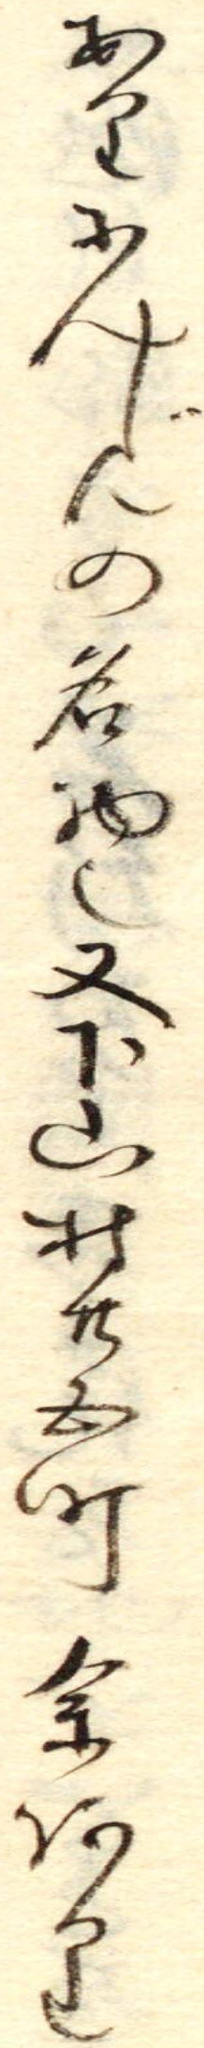ありにんじんの名物也又下山村廿五町余あり
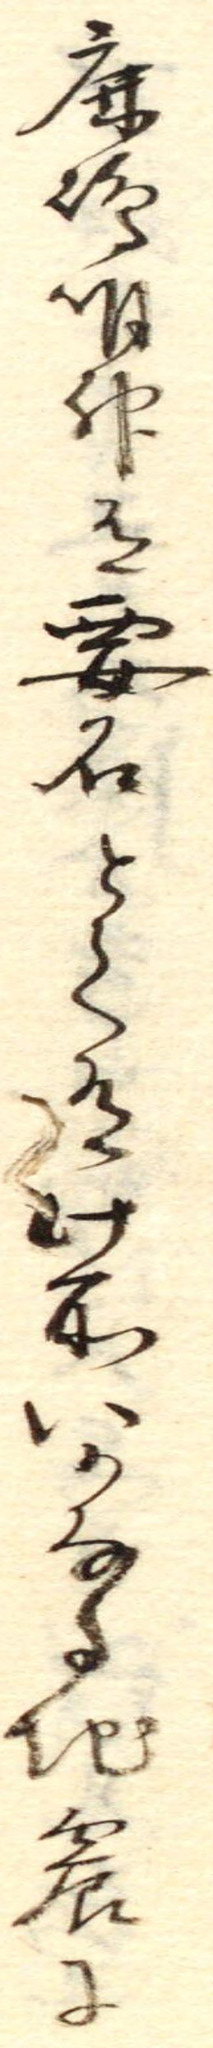鹿嶋明神有要石とて有此所はいかなる地震に
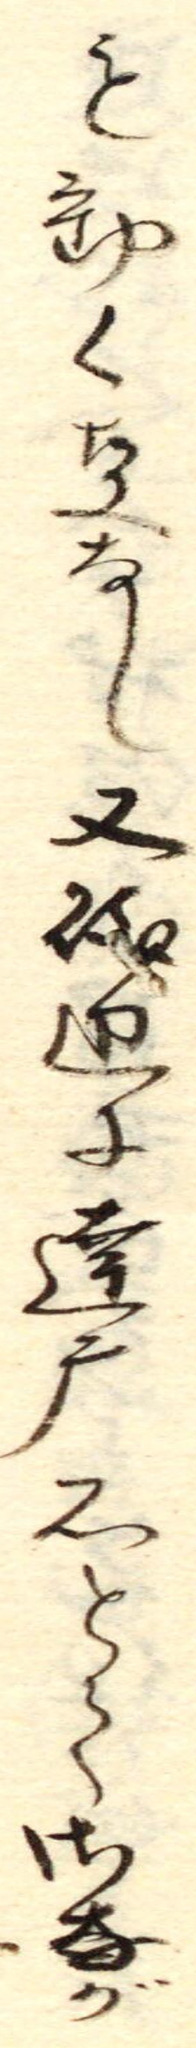も動く事なし又礒辺に達磨石とて御なが
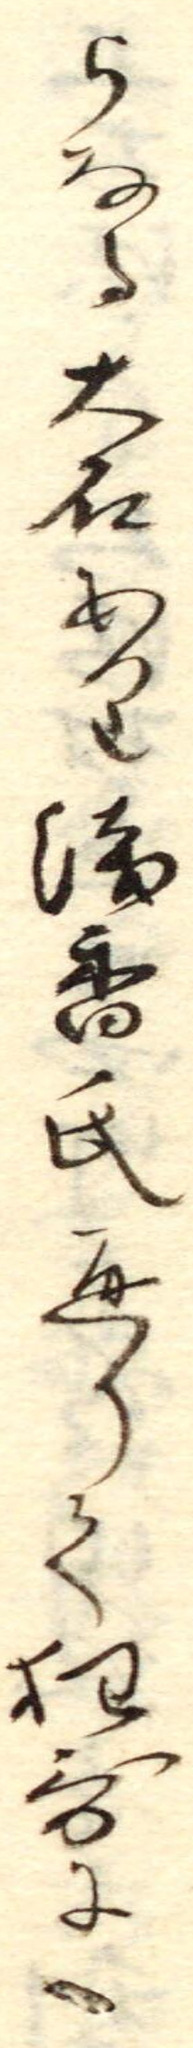らなる大石あり浅香氏通りて狂哥に
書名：能登名跡誌
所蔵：Ishikawa Prefectural Library
